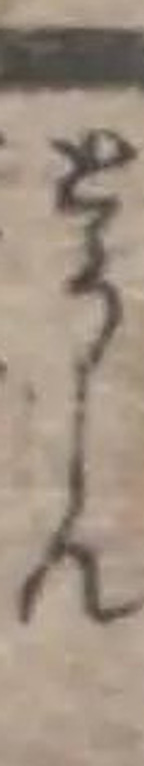とうしん
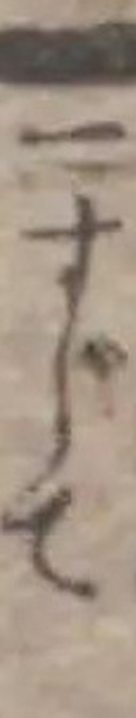一すじて
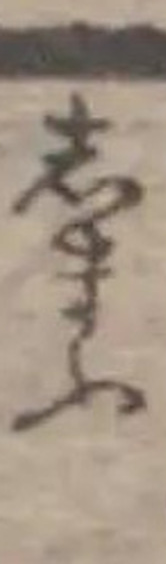しまふ
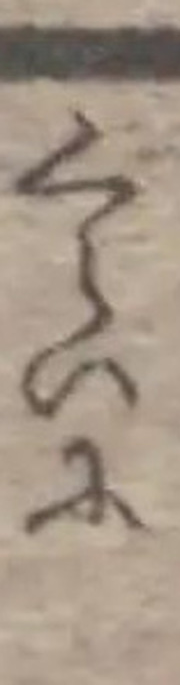くらいに
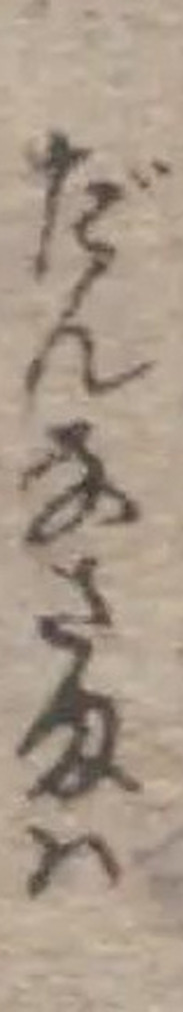だんなさまは
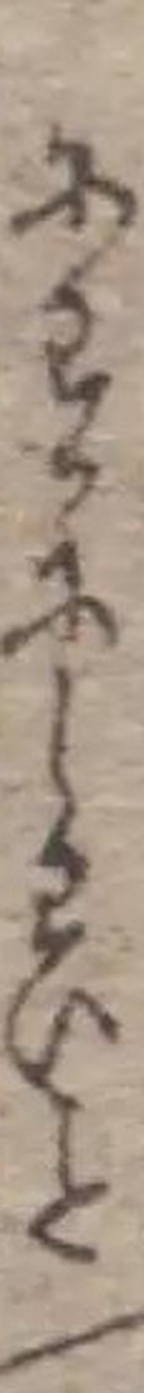にわかにしわいこと
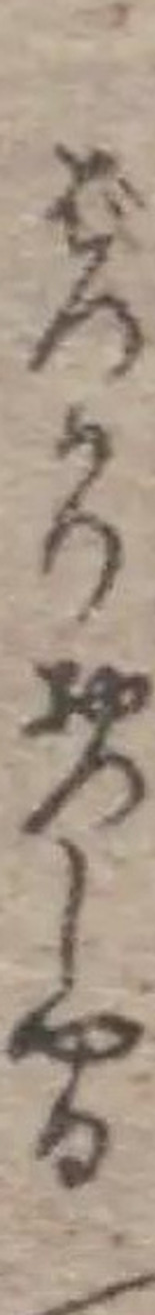ばつかりおつしやる

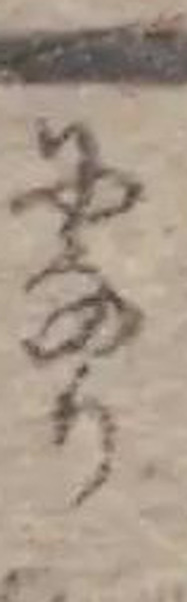になり
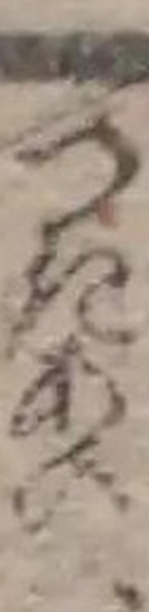つきあい
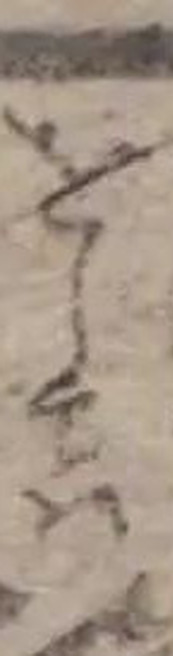をしては
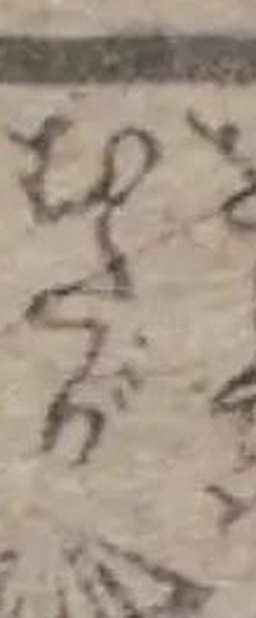むだが
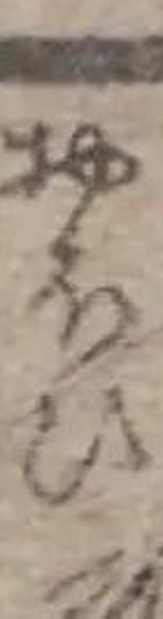おほひ
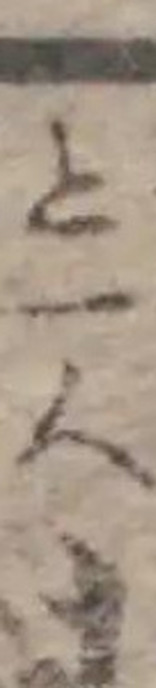と一人
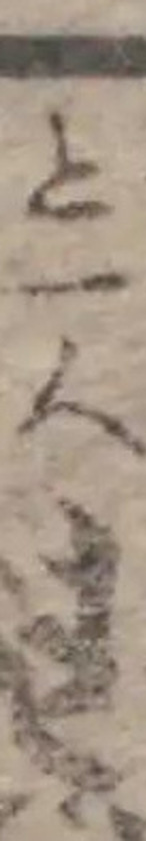と一人
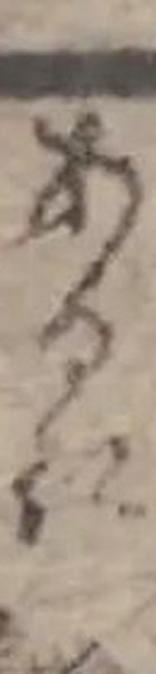あるき
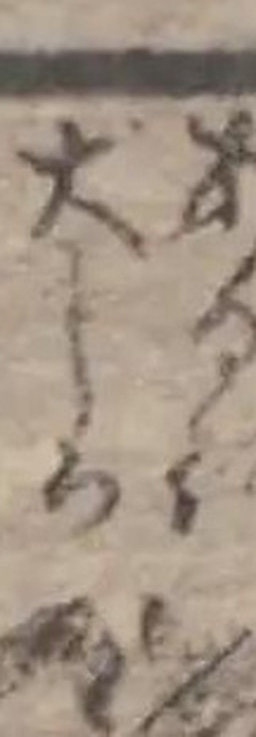大しろ
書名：富多高慢噺 3巻
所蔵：国立国会図書館 National Diet Library, JAPAN
